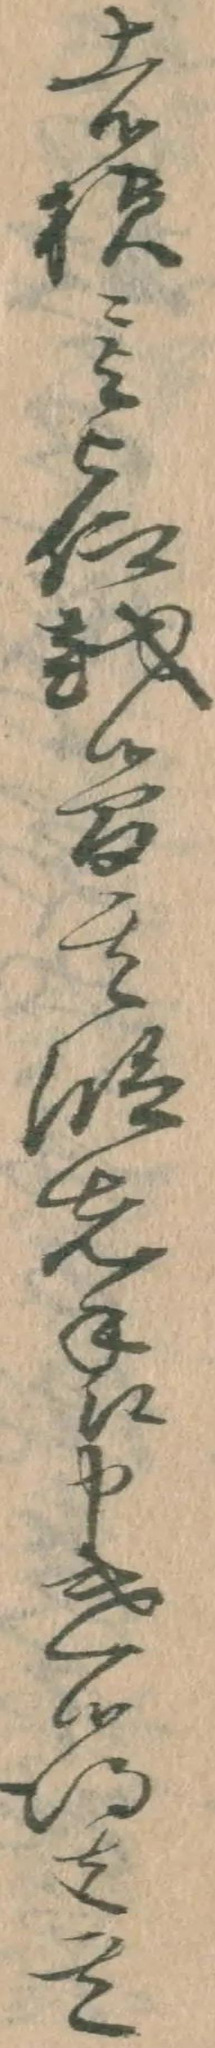上候様に与被仰越候間其段先手江申遣候得者其
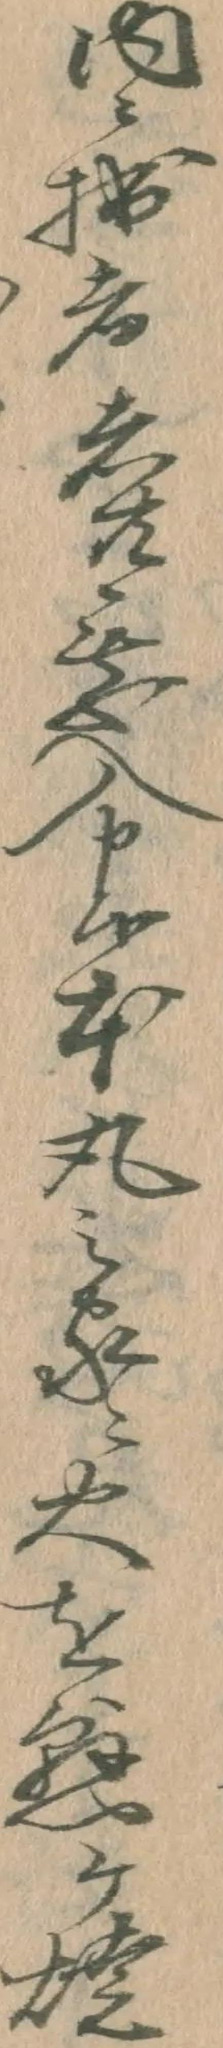内に拙者者共乗入申候本丸之家に火を懸け焼
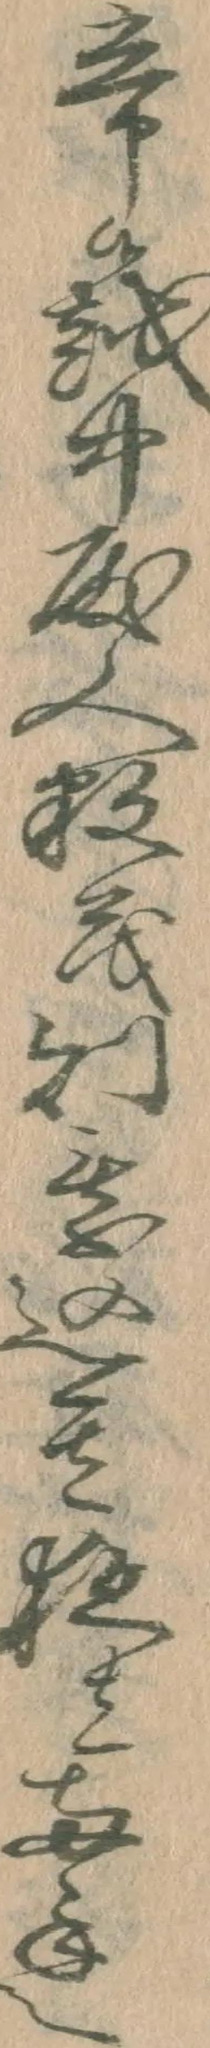立申候越中殿人数茂則乗込其夜者両手之
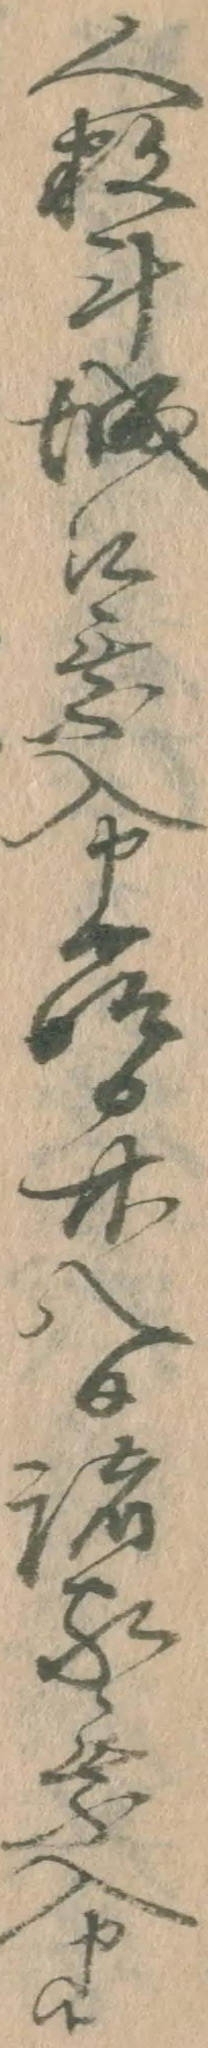人数斗城江乗入申候明日廿八日諸家乗入申候
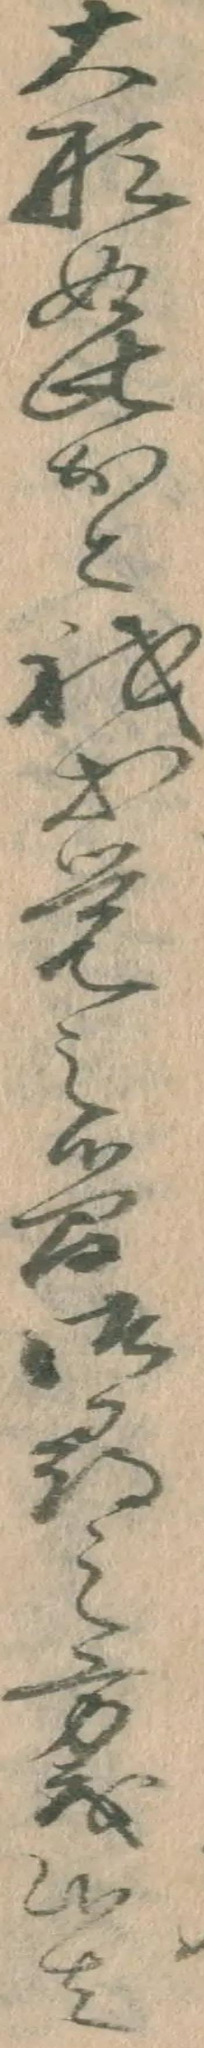大形如此かと我等覚之候間御尋之方茂候者
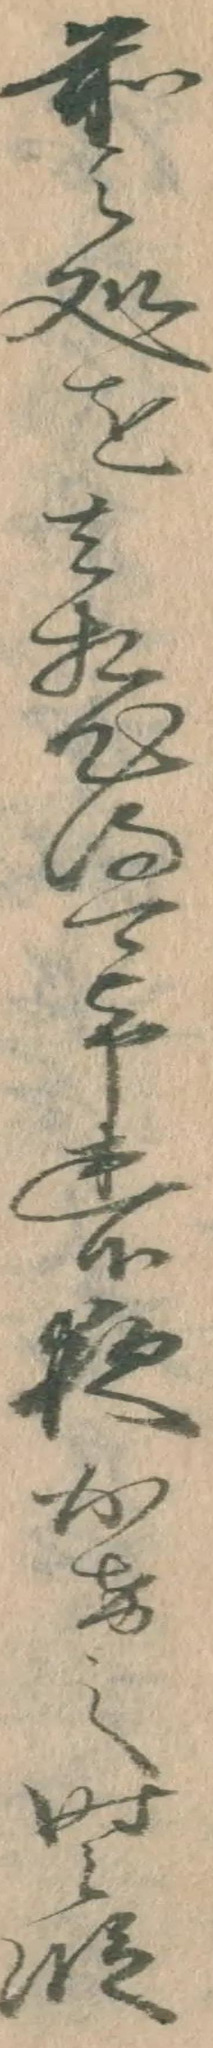前之処を者相心得可被申迚候夜か希之時之段
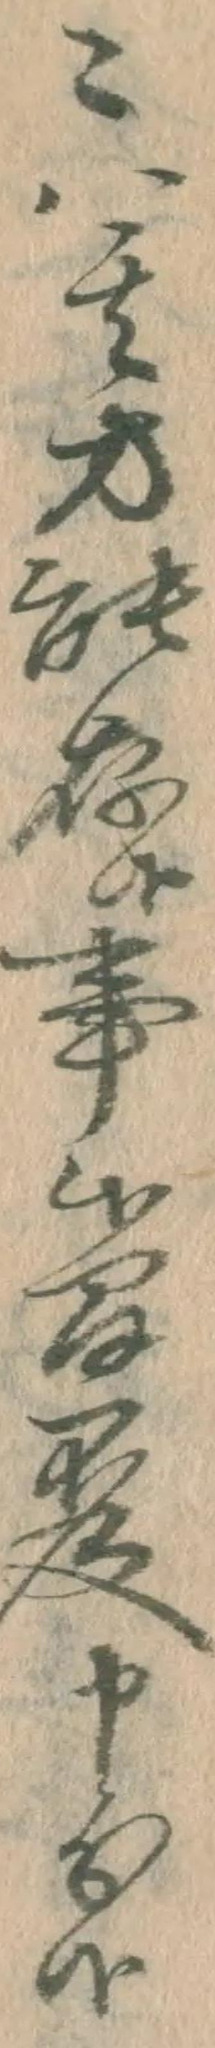には其方能存候事候間不及申分候
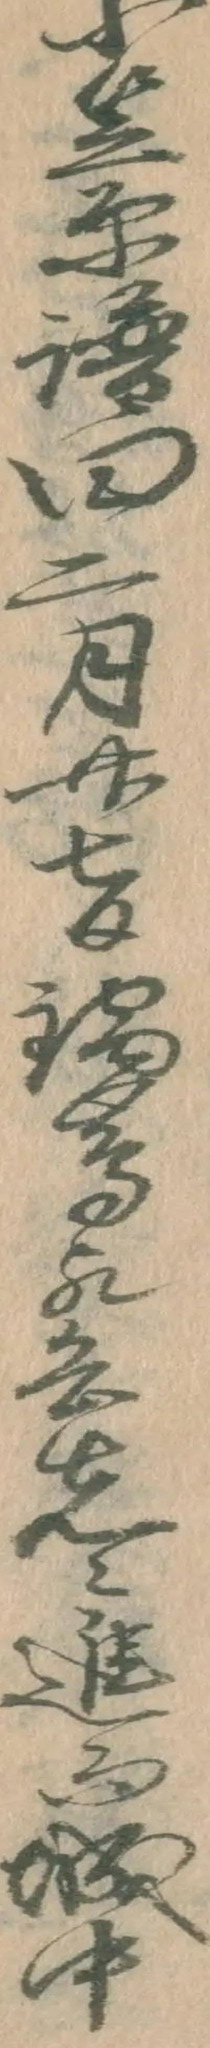小笠原譜曰二月廿七日鍋島歟兵先に進而城中
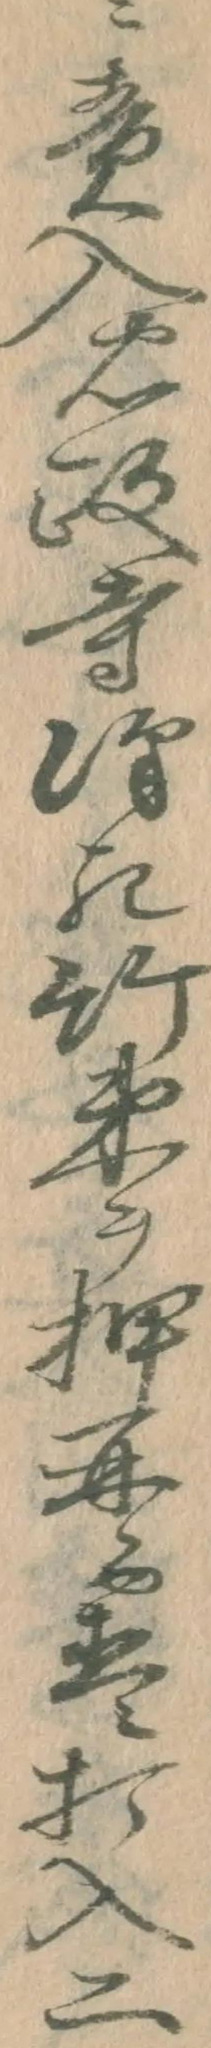に責入忠政寺沢歟竹束を押並而直に打入二

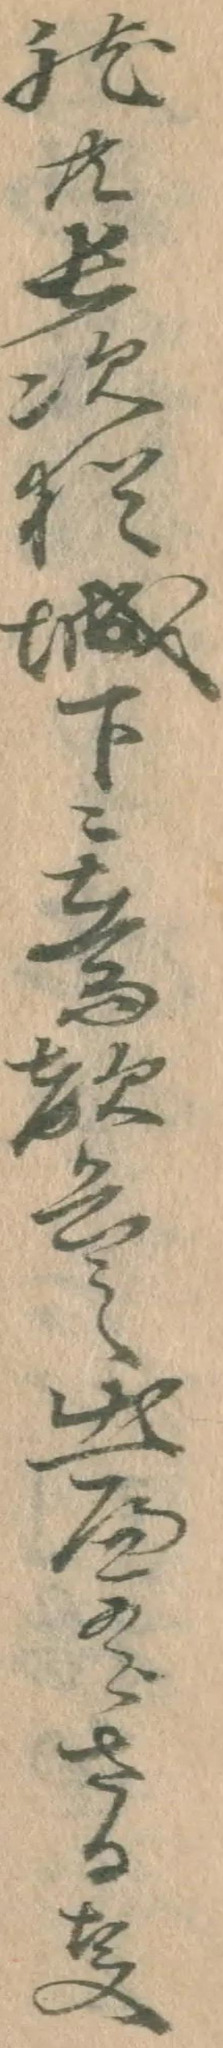然共長次猶城下に在而敵兵之出扁可らさる事
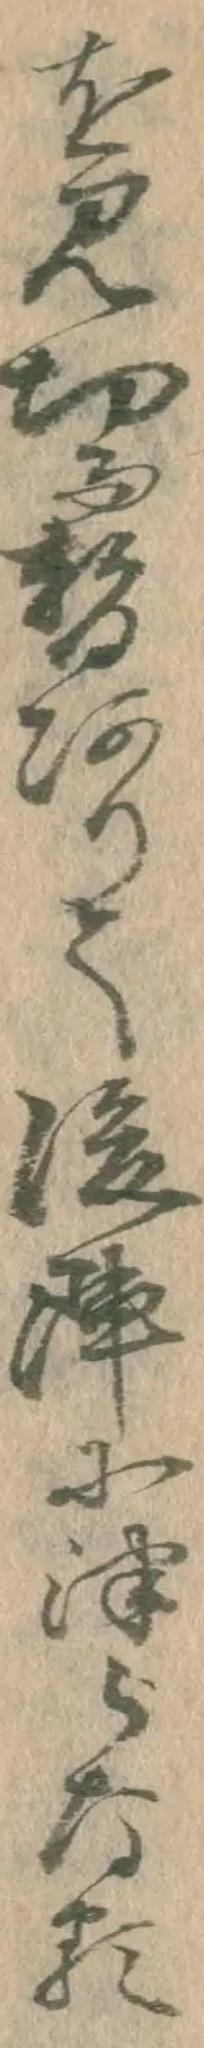を見切而暫阿りて後陣尓津らな類
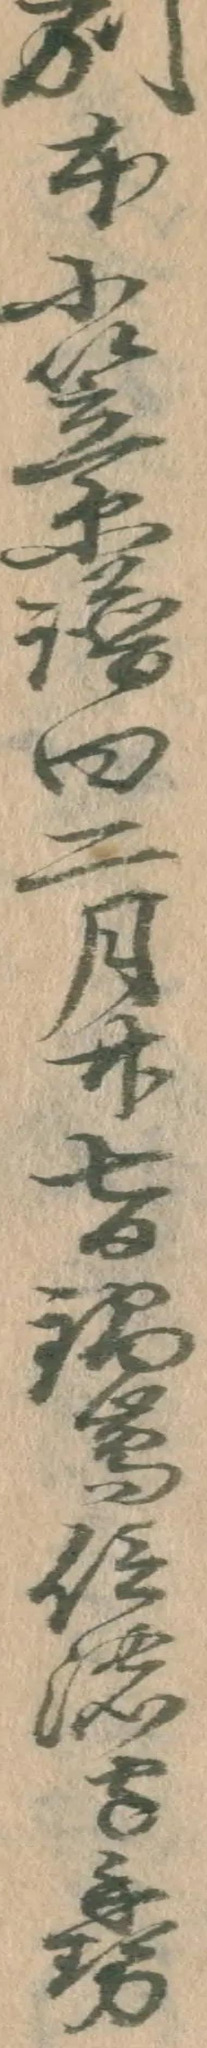別本小笠原譜曰二月廿七日鍋島信濃守手勢
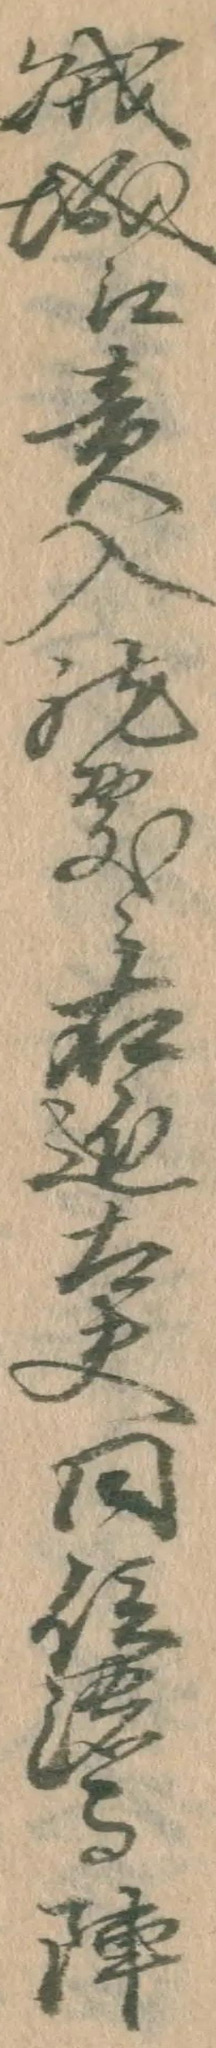賊城江責入然處に右近太夫同信濃守陣
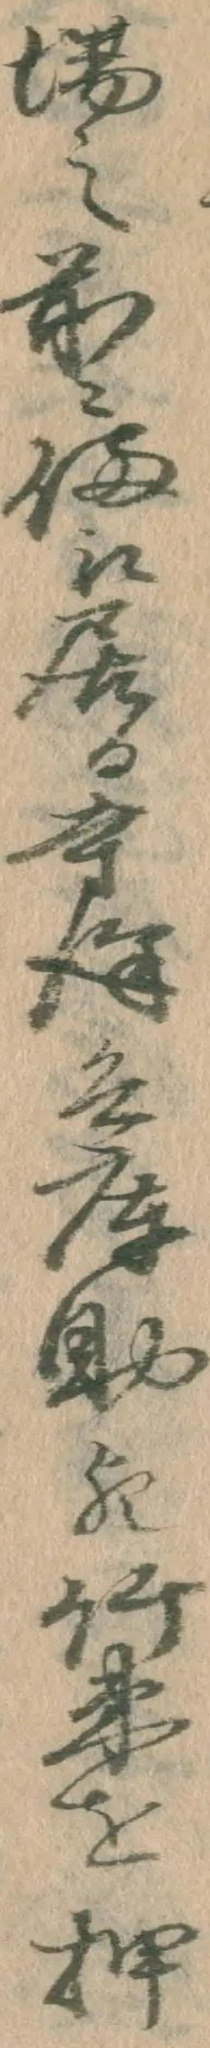場之前に備江居る寺沢兵庫助歟竹束を押
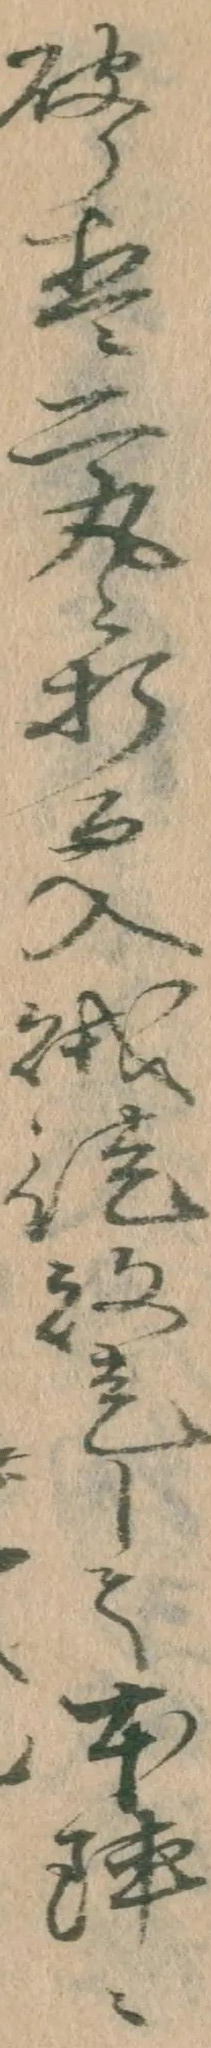破り直に二丸に打而入賊徒敗走して本陣に
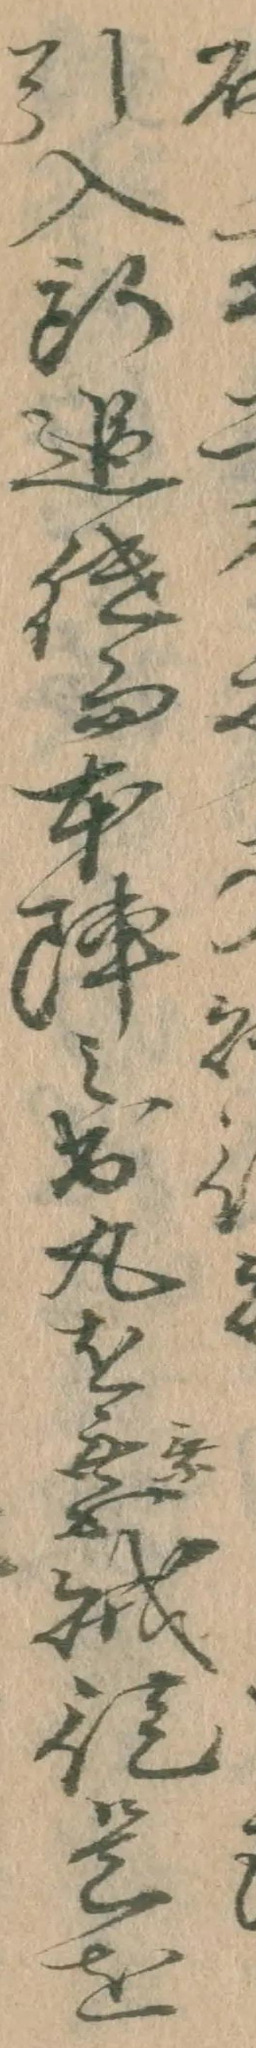引入所追鑓而本陣之出丸を乗賊徒是を
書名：切支丹御退治記 49巻. [8]
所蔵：国立国会図書館 National Diet Library, JAPAN
